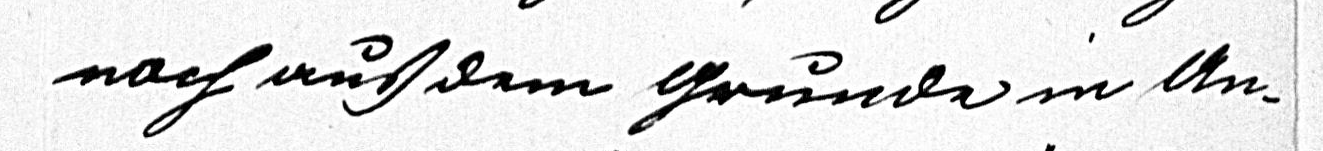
noch aus dem Grunde in An¬
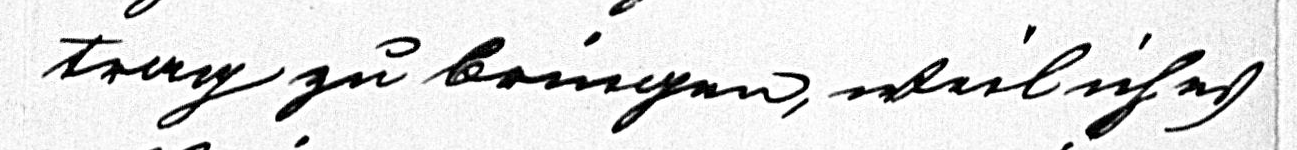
trag zu bringen, weil ich es
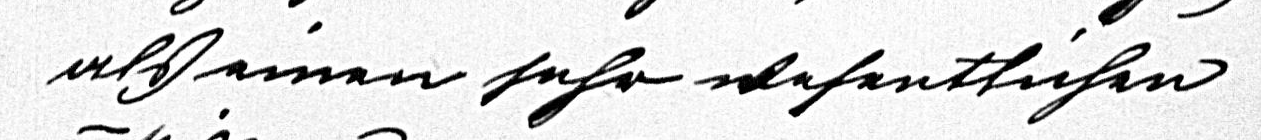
als einen sehr wesentlichen
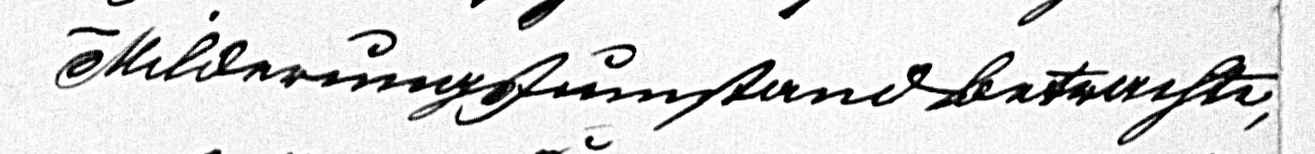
Milderungsumstand betrachte,
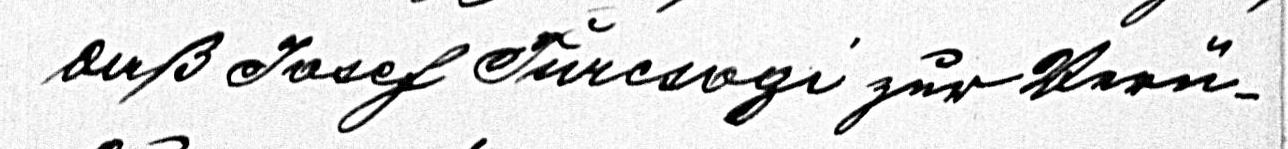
auß Josef Turcsogi zur Verü¬
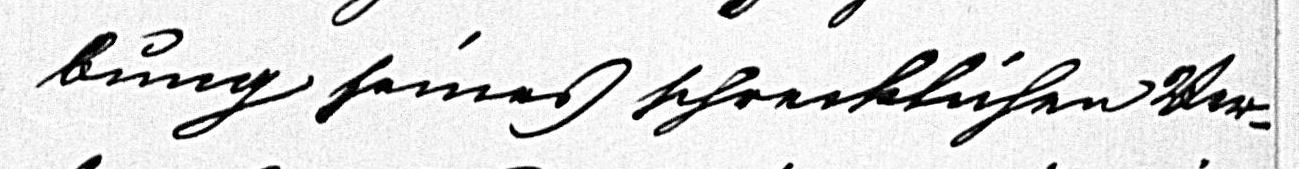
bung seines schrecklichen Ver¬
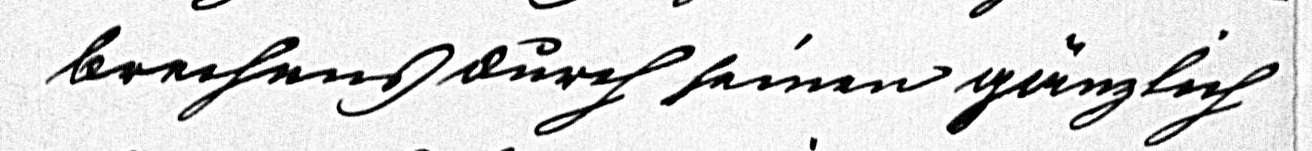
brechens durch seinen gänzlich
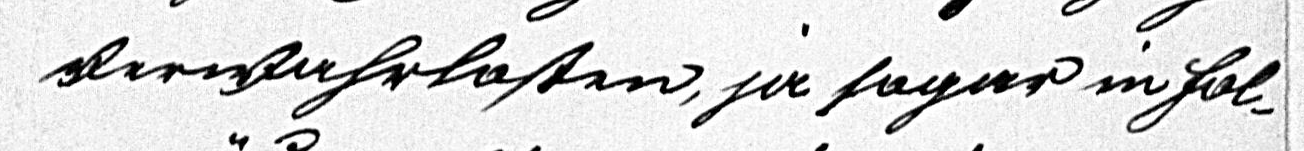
verwahrlosten, ja sogar in Fol¬
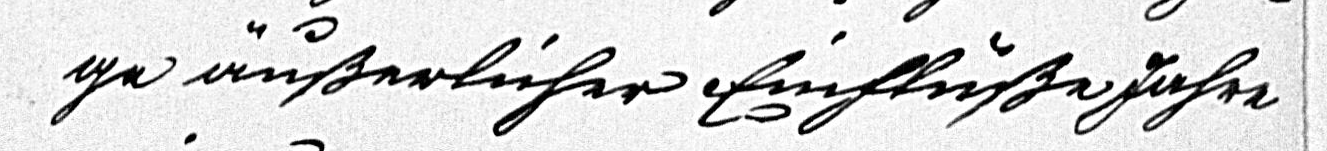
ge äußerlicher Einflüße Jahre
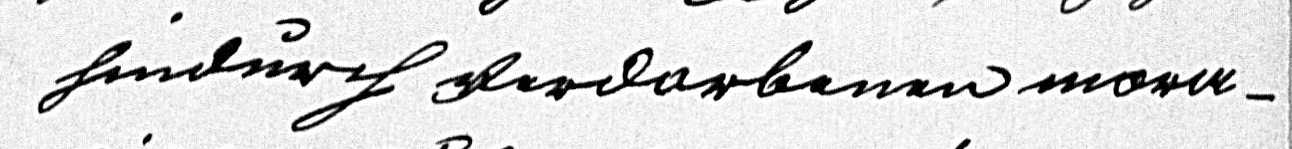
hindurch verdorbenen mora¬
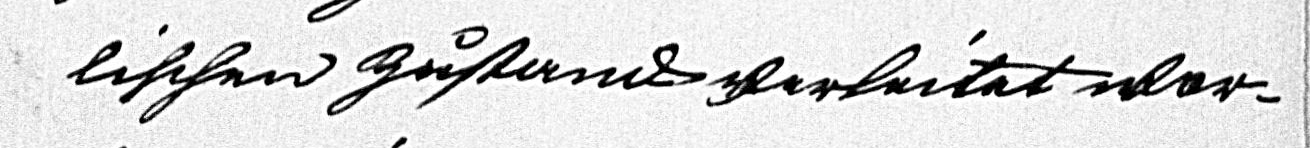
lischen Zustand verleitet wor¬
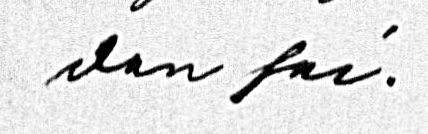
den sei.
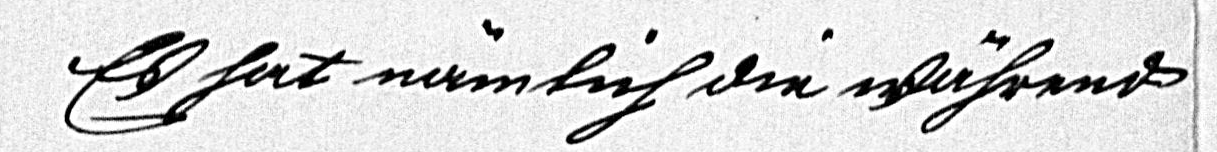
Es hat nämlich die während
